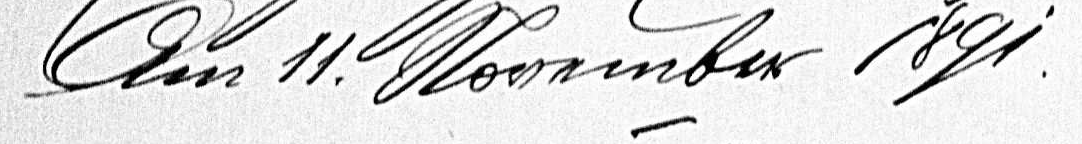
Am 11. November 1891
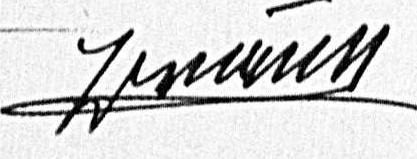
Braun
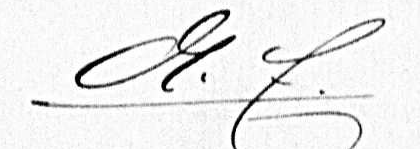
A. E.
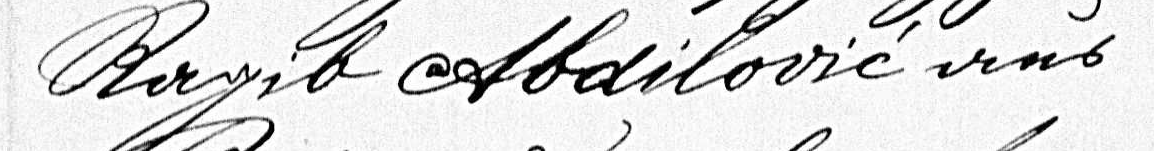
Ragib Abdilović aus
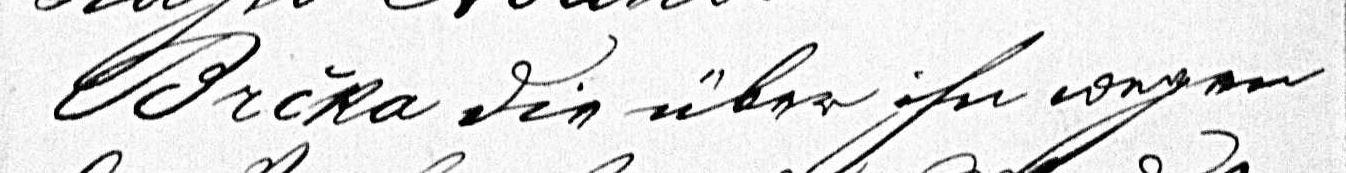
Brčka die über ihn wegen
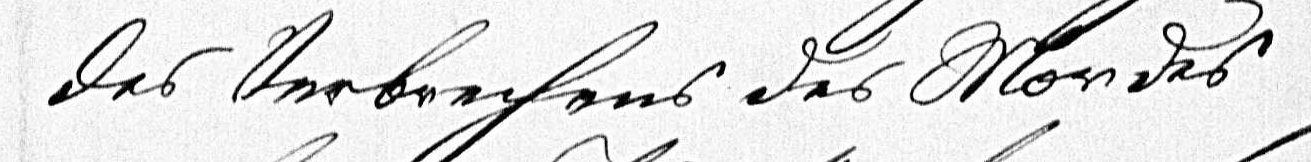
des Verbrechens des Mordes
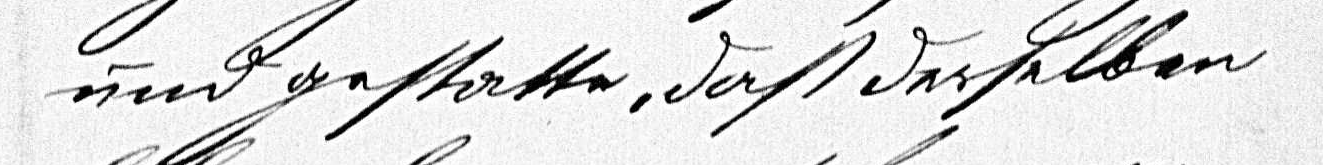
und gestatte, daß derselben
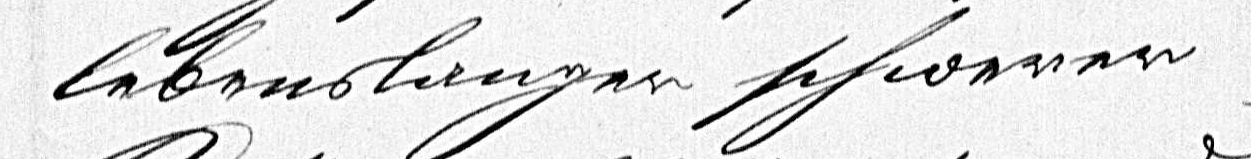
lebenslanger schwerer
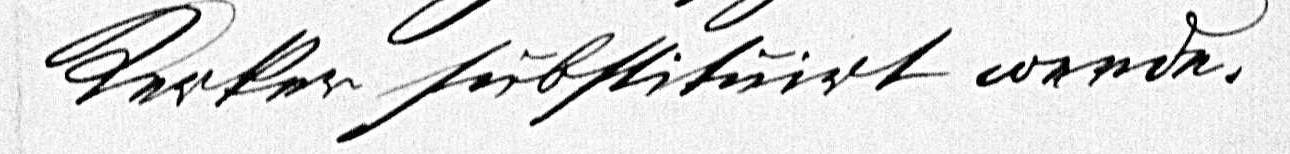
Kerker substituirt werde.
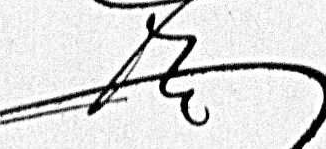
FJ
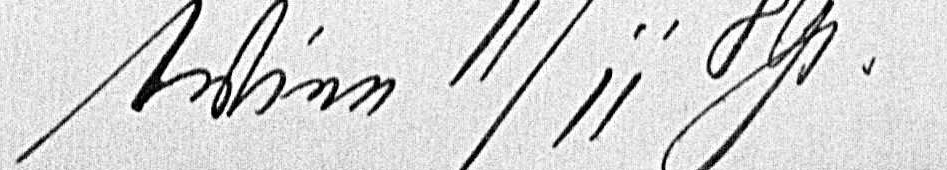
Wien, 11/11/1891
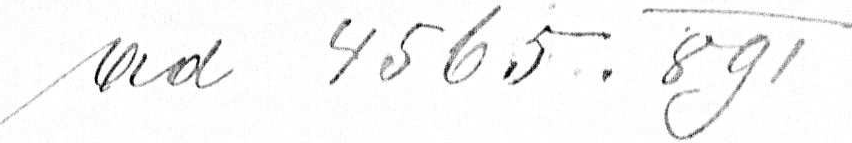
ad 4565 1891/
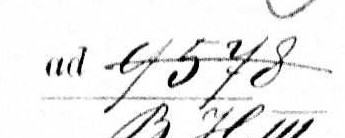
ad
